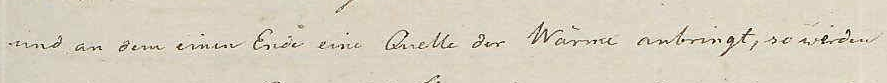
und an dem einen Ende eine Quelle der Wärme anbringt, so werden
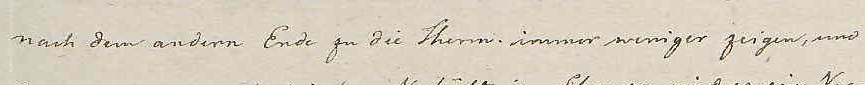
nach dem andern Ende zu die Therm. immer weniger zeigen, und
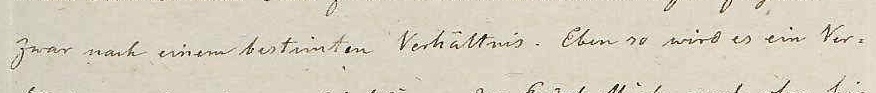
zwar nach einem bestimten Verhältnis. Eben so wird es ein Ver-
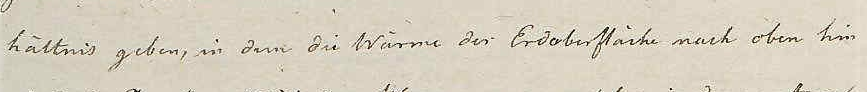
hältnis geben, in dem die Wärme der Erdoberfläche nach oben hin
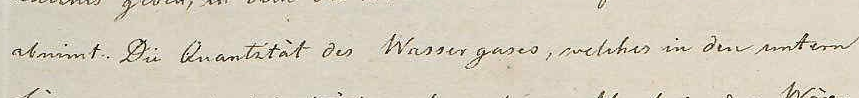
abnimt. Die Quantität des Wassergases, welches in den untern
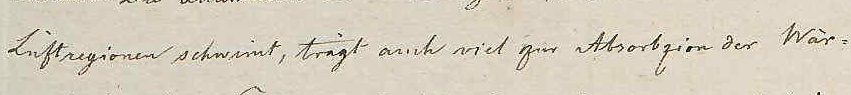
Luftregionen schwimt, trägt auch viel zur Absorbzion der Wär-
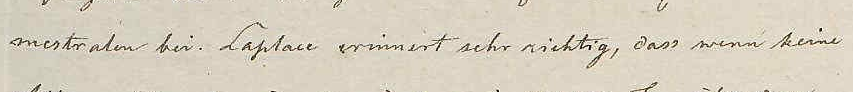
mestralen bei. Laplace erinnert sehr richtig, dass wenn keine
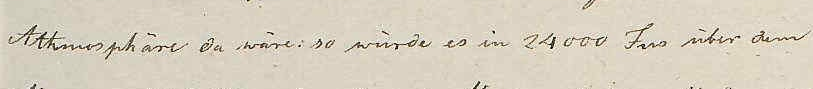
Athmosphäre da wäre: so würde es in 24000 Fus über dem
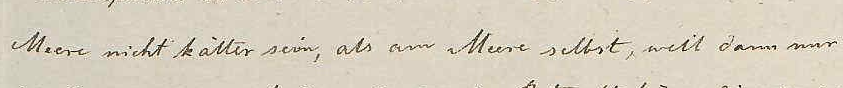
Meere nicht kälter sein, als am Meere selbst, weil dann nur
